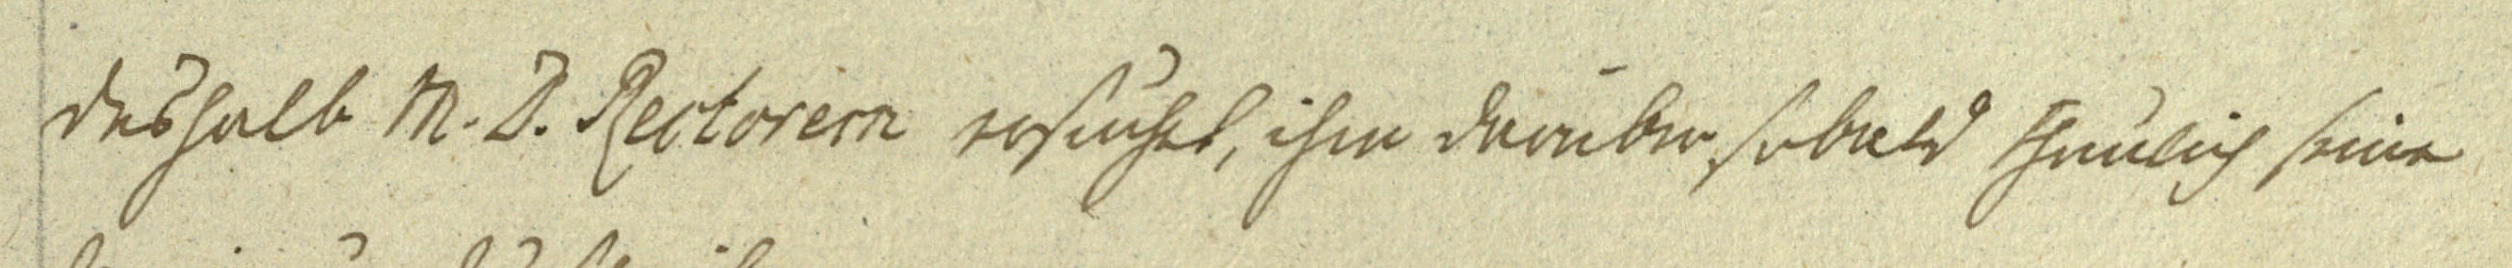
deshalb M. D. Rectorem ersuchet, ihm darüber sobald thunlich seine
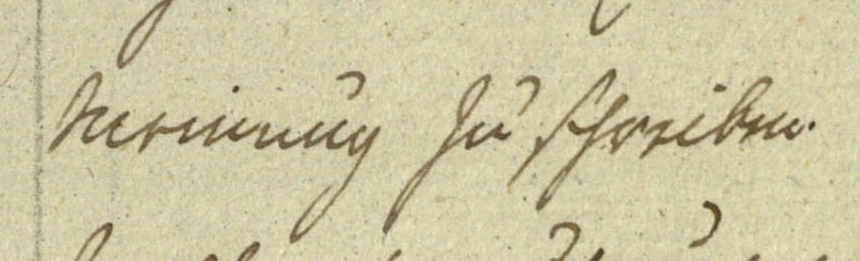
Meinung zu schreiben.
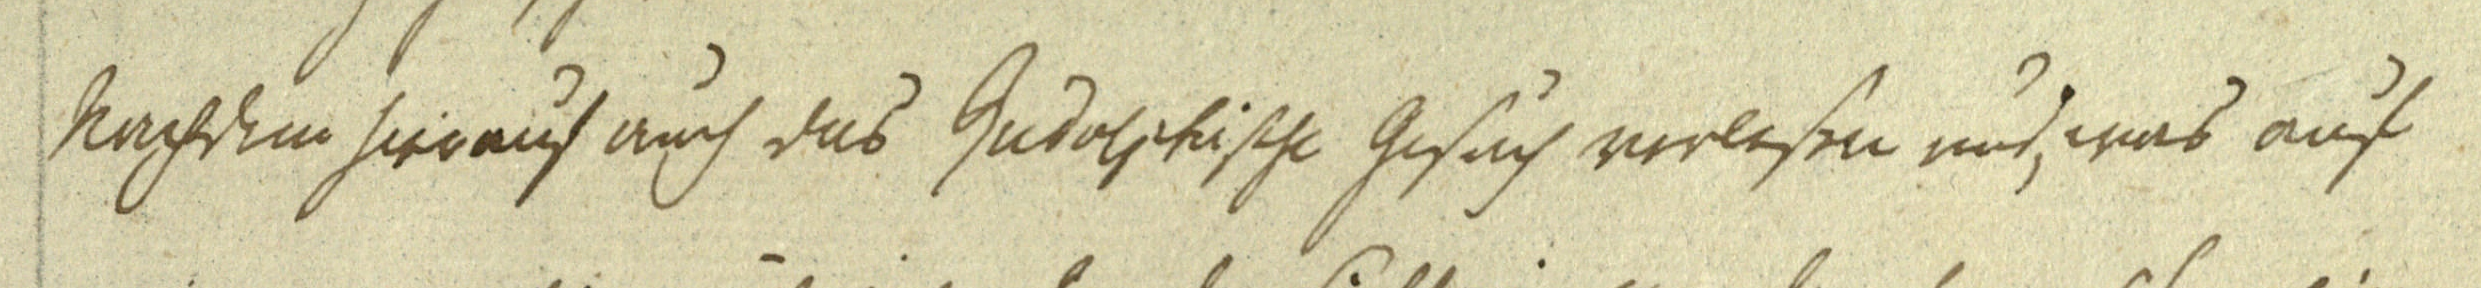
Nachdem hierauf auch das Rudolphische Gesuch verlesen und, was auf
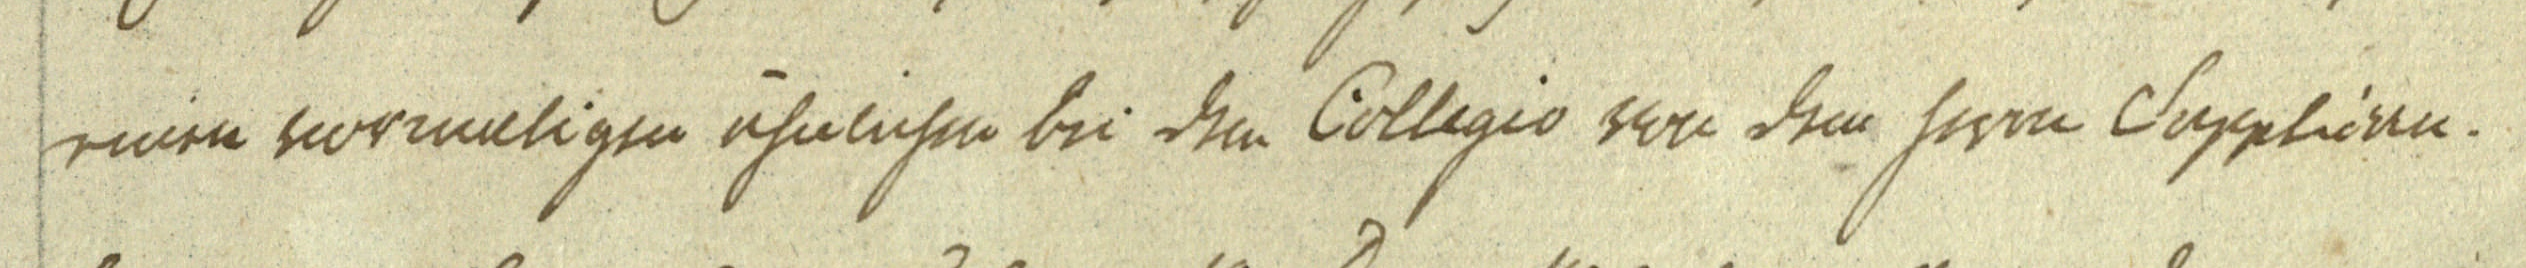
einen vormaligen ähnlichen bei dem Collegio von dem Herrn Supplican¬
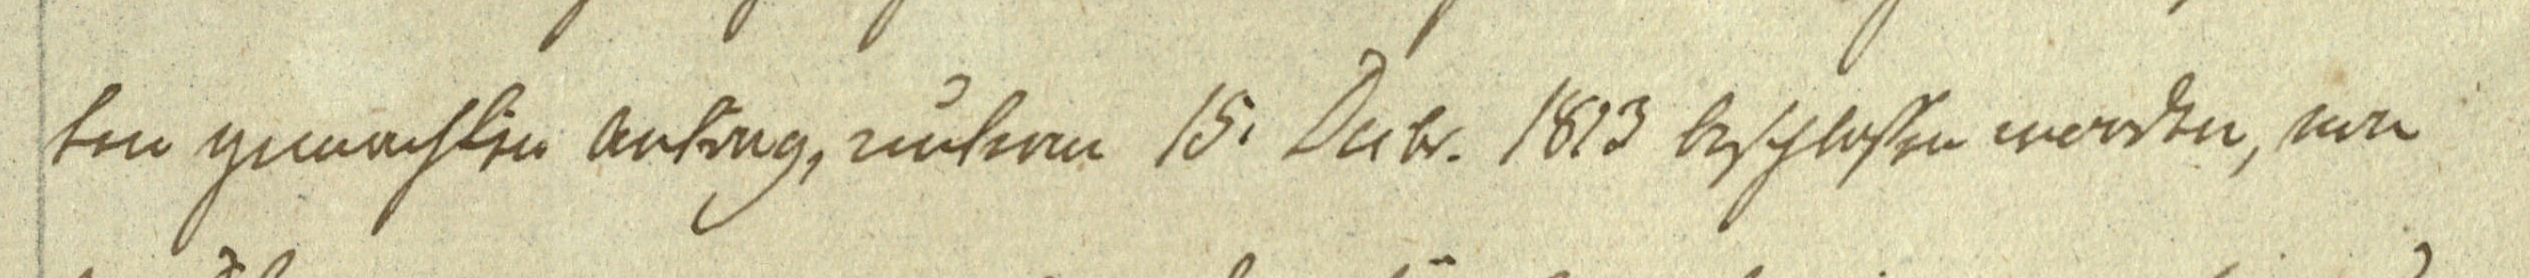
ten gemachten Antrag, unterm 15. Decbr. 1813 beschlossen worden, von
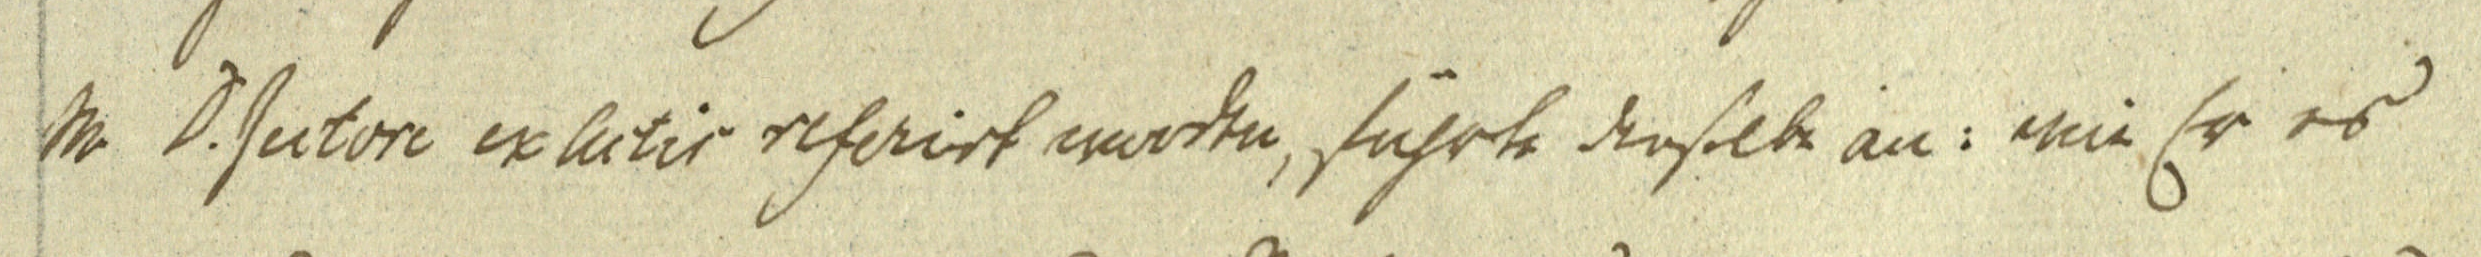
M D. Rectore ex Actis referirt worden, führte derselbe an: wie Er es
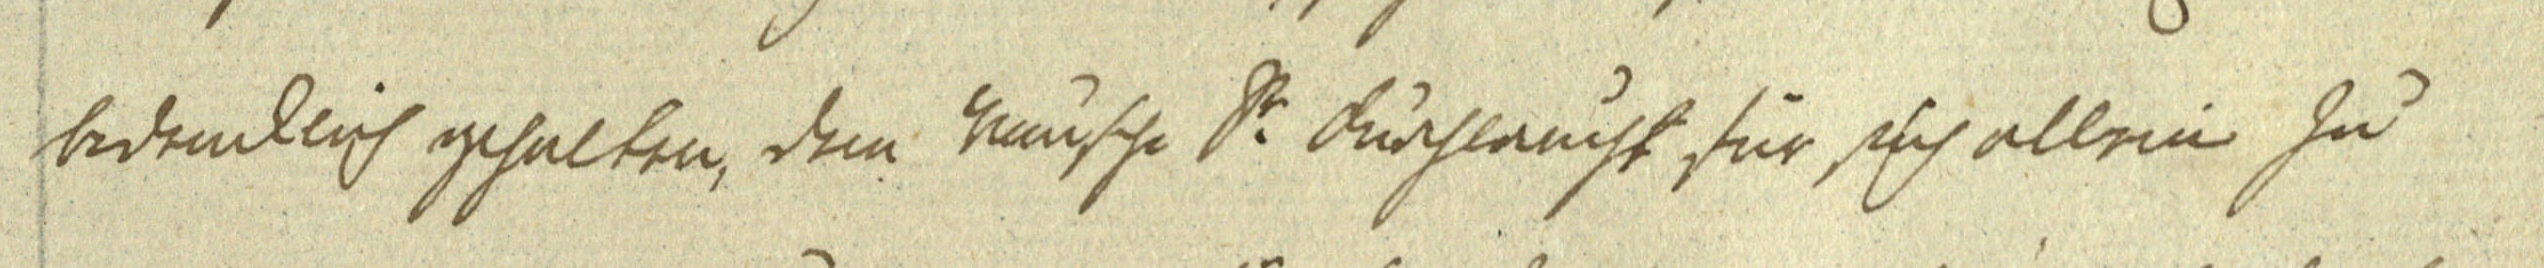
bedencklich gehalten, dem Wunsche Sr. Durchlaucht für sich allein zu
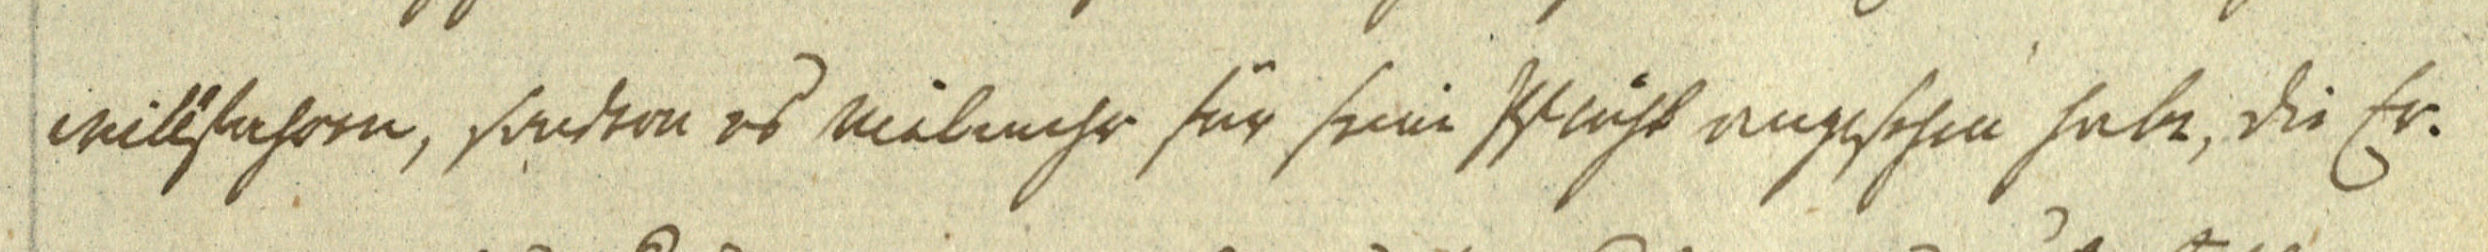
willfahren, sondern es vielmehr für seine Pflicht angesehen habe, die Er¬
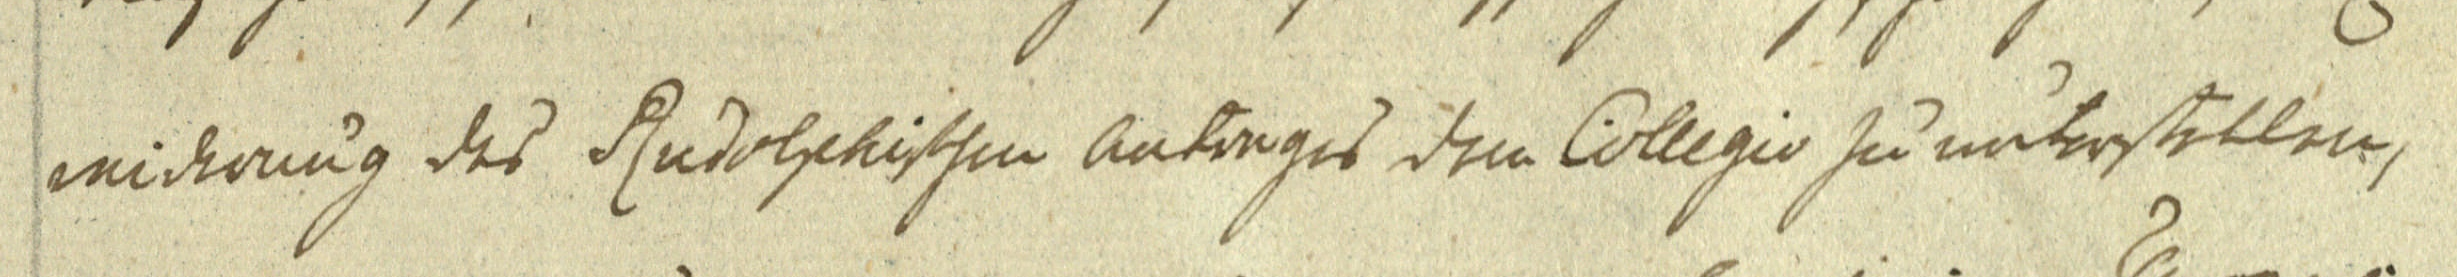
widerung des Rudolphischen Antrages dem Collegio zu unterstellen,
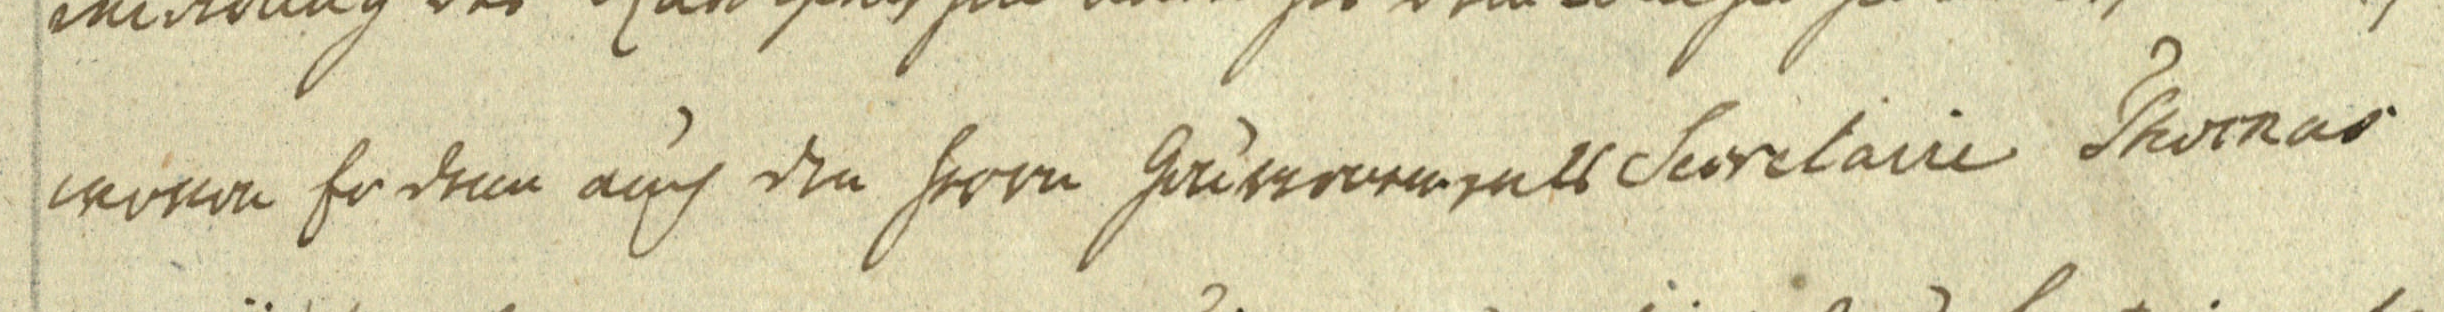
wovon Er denn auch den Herrn Gouvernements Secretaire Thomas
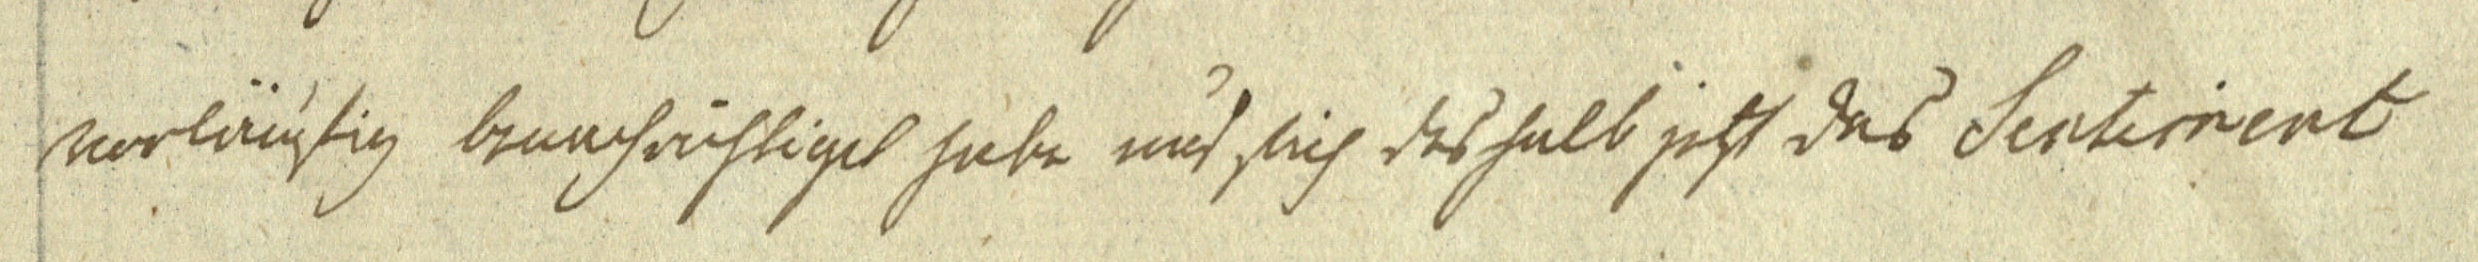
vorläufig benachrichtiget habe und sich deshalb jetzt das Sentiment
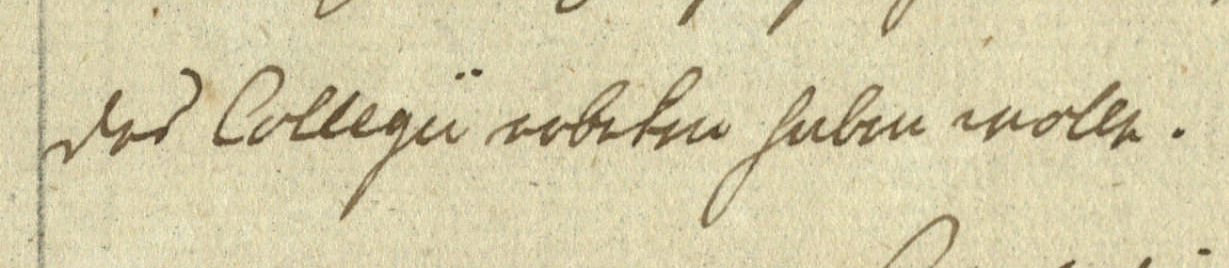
des Collegii erbeten haben wolle.
